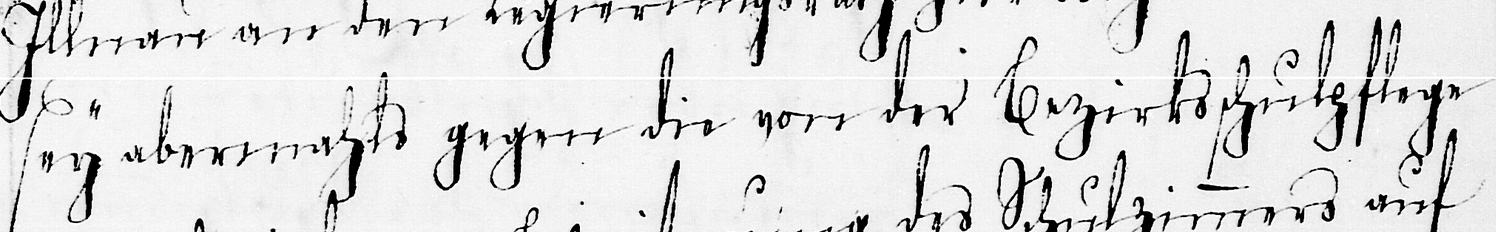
sey abermahls gegen die von der Bezirksschulpflege
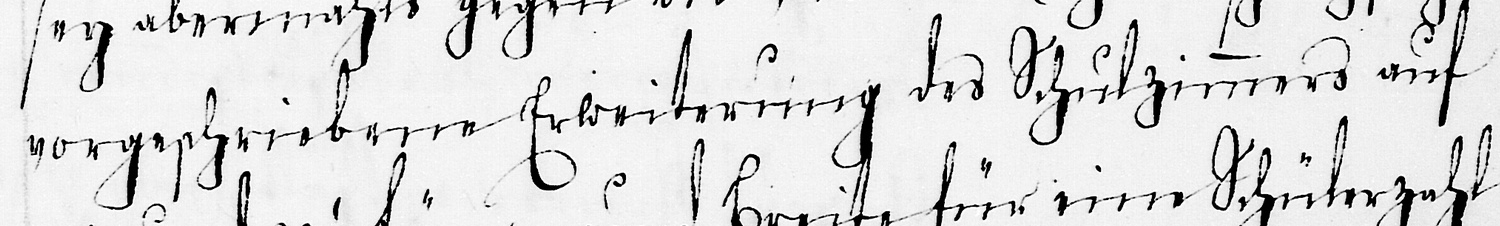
vorgeschriebene Erweiterung des Schulzimmers auf
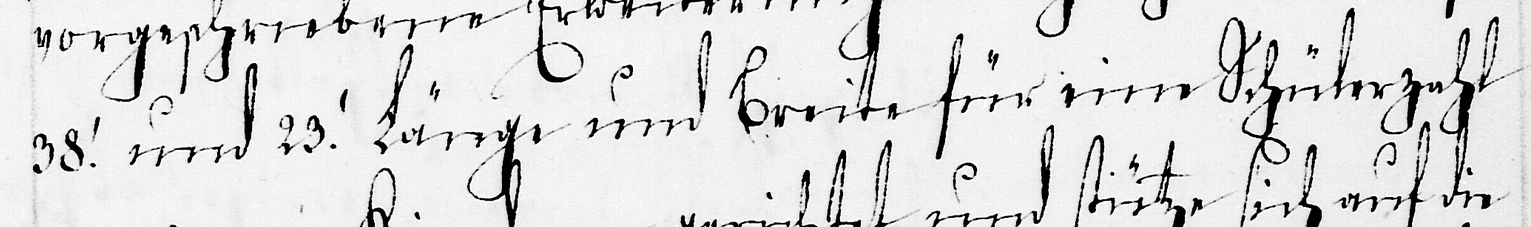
38.‘ und 23.‘ Länge und Breite für eine Schülerzahl
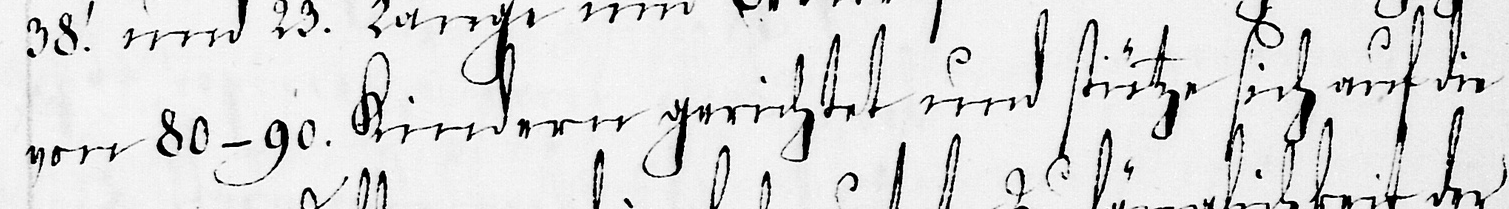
von 80–90. Kindern gerichtet und stütze sich auf die
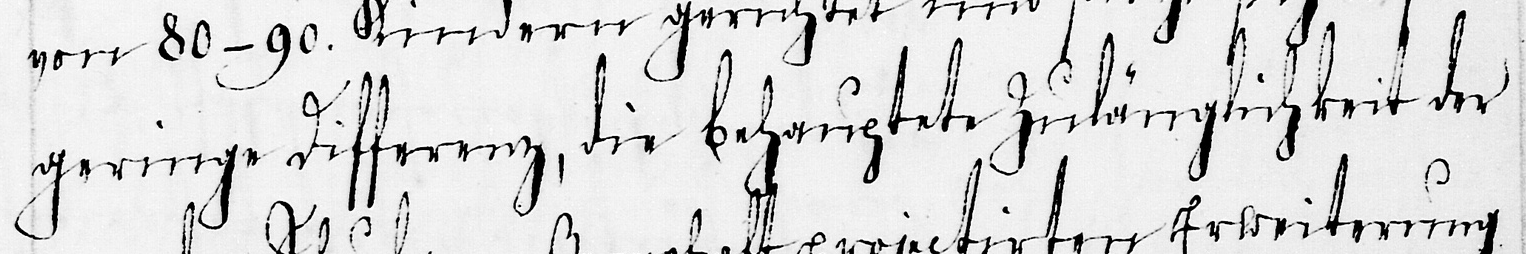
geringe Differenz, die behauptete Zulänglichkeit der
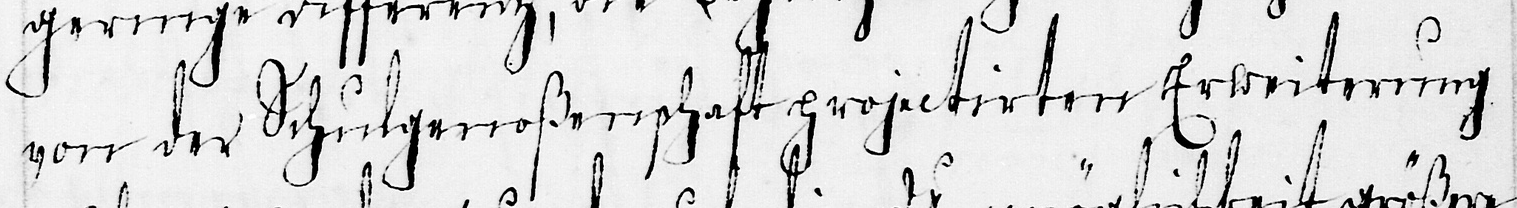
von der Schulgenoßenschaft projectirten Erweiterung
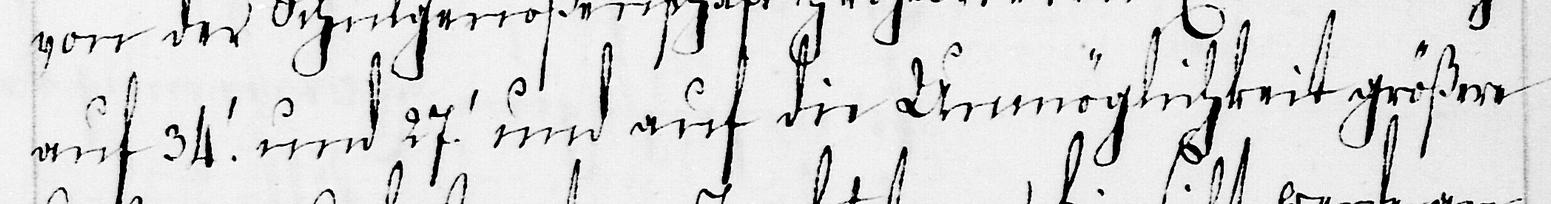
auf 34.‘ und 27.‘ und auf die Unmöglichkeit größere
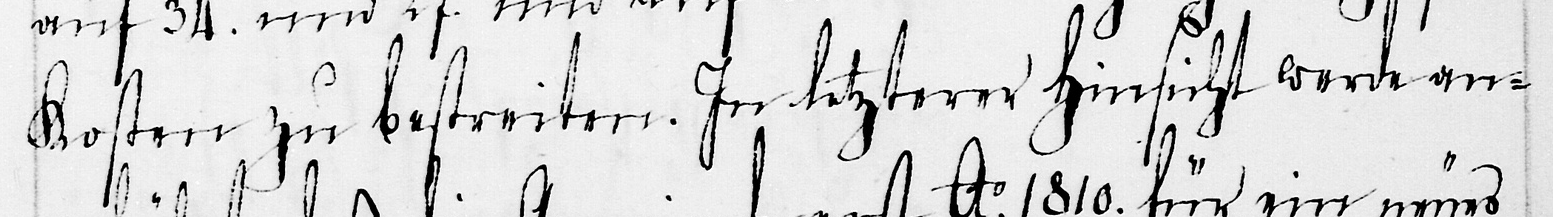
Kosten zu bestreiten. In letzterer Hinsicht werde an¬
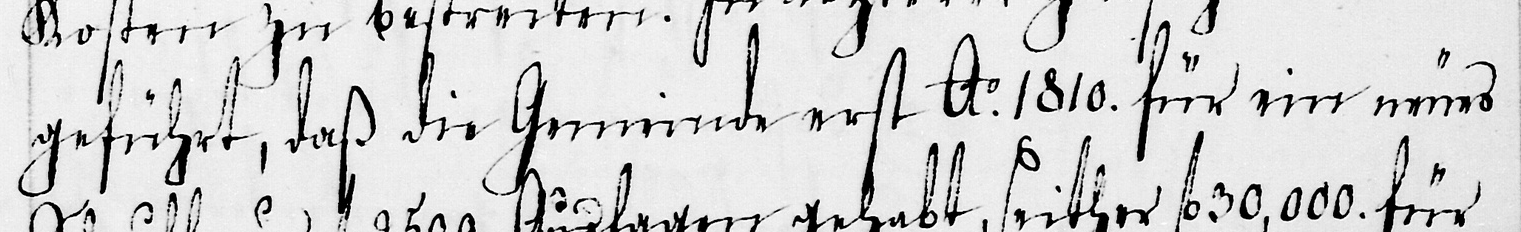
geführt, daß die Gemeinde erst Ao. 1810. für ein neues
